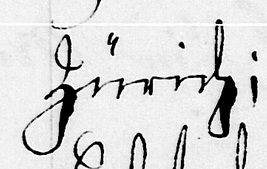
Zürich;
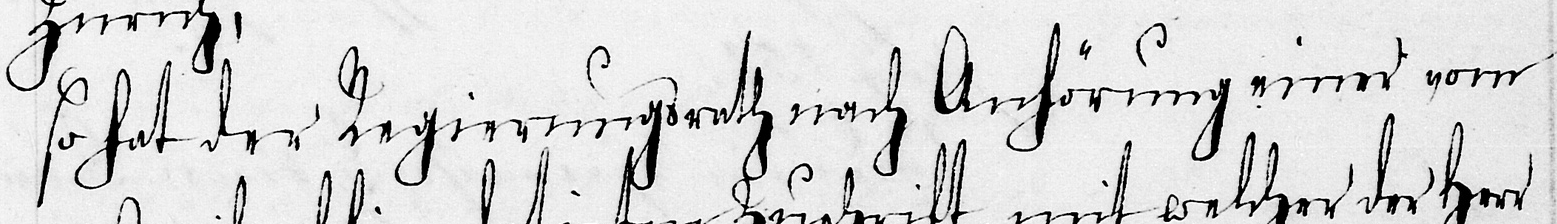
so hat der Regierungsrath nach Anhörung einer vom
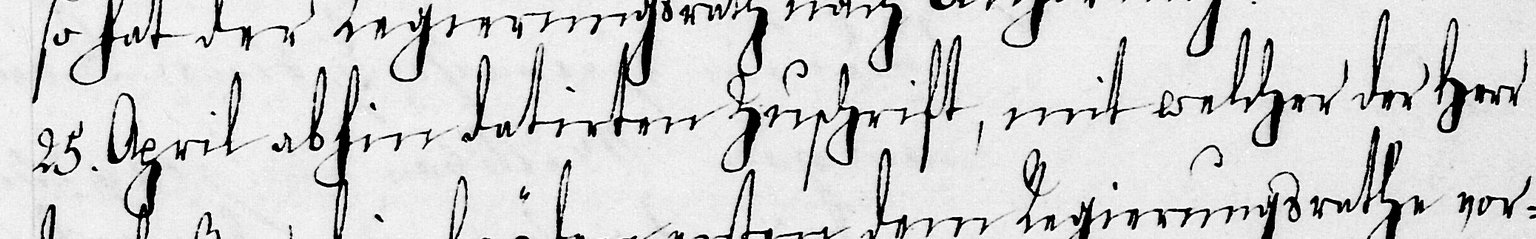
25. April abhin datirten Zuschrift, mit welcher der Herr
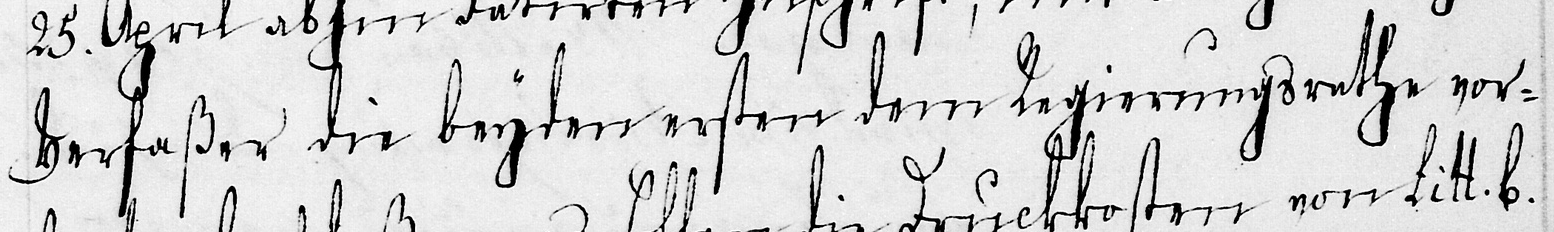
Verfaßer die beyden ersten dem Regierungsrathe vor¬
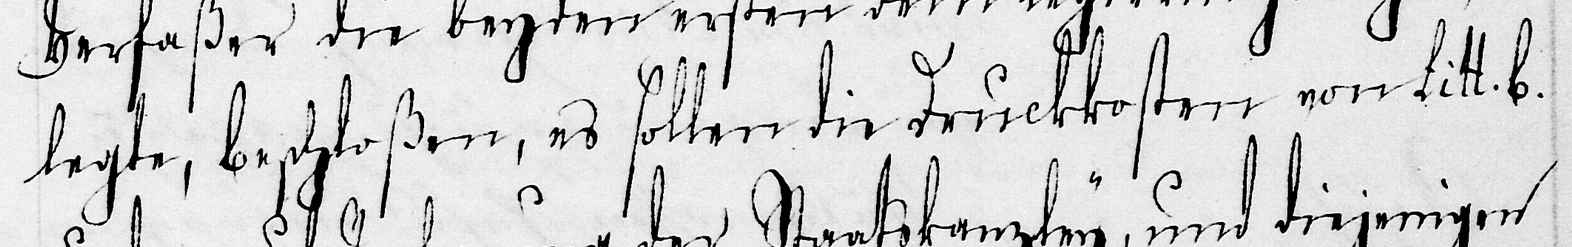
legte, beschloßen, es sollen die Druckkosten von Litt.
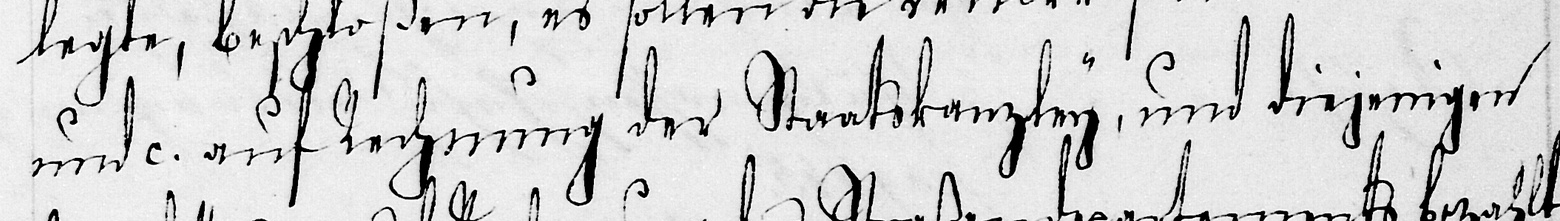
und c. auf Rechnung der Staatskanzley, und diejenigen
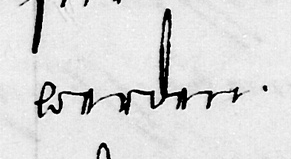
werden.
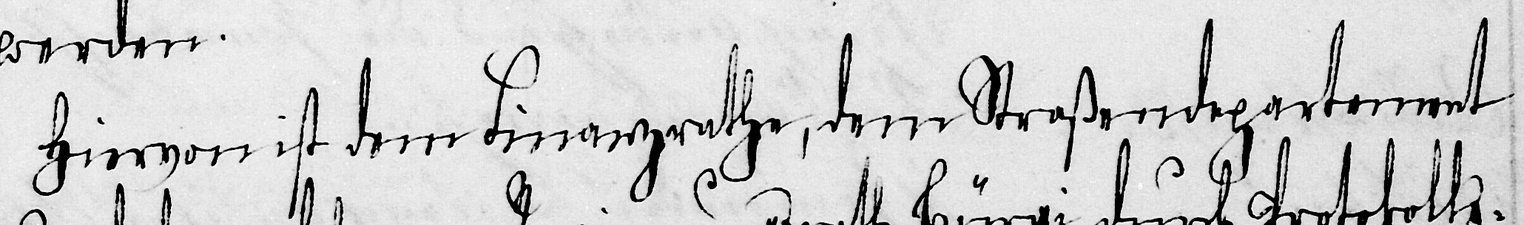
Hiervon ist dem Finanzrathe, dem Straßendepartement
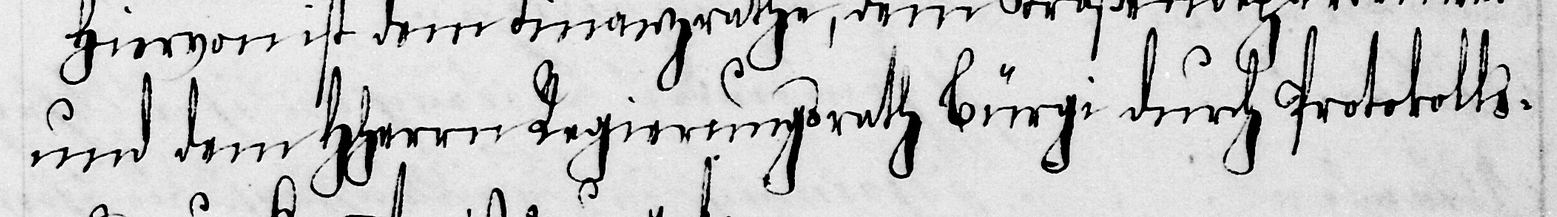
und dem HHerrn Regierungsrath Bürgi durch Protokoll¬
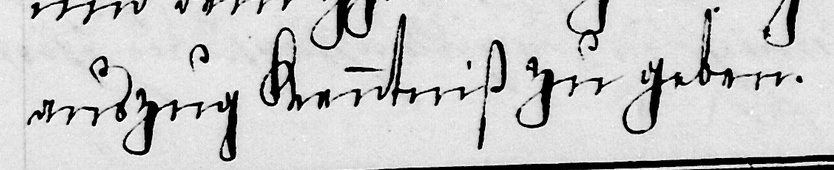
sauszug Kenntniß zu geben.
